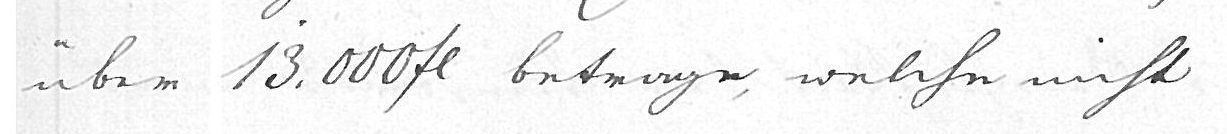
über 13.000 fl betrage, welche nicht
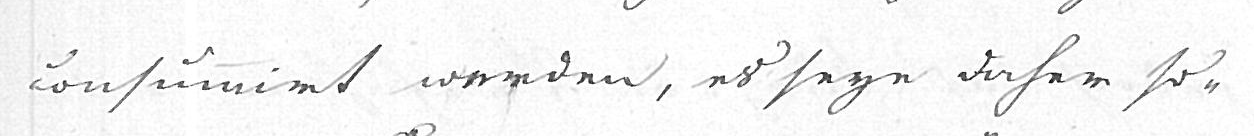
consumirt worden, es seye daher so-
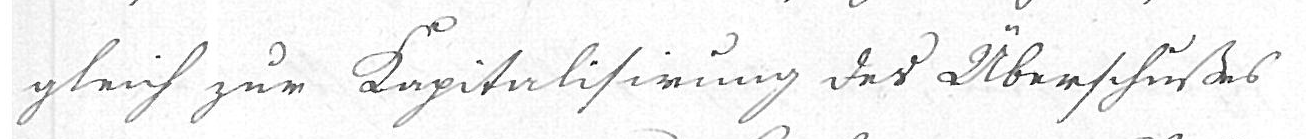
gleich zur Kapitalisierung des Überschußes
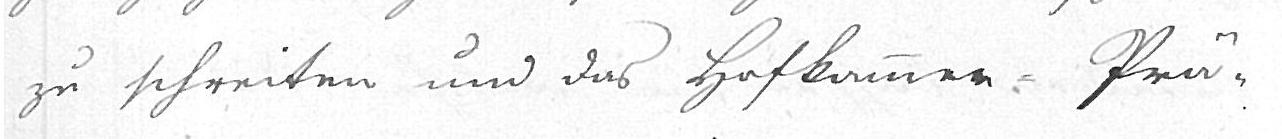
zu schreiten und das Hofkammer-Prä-
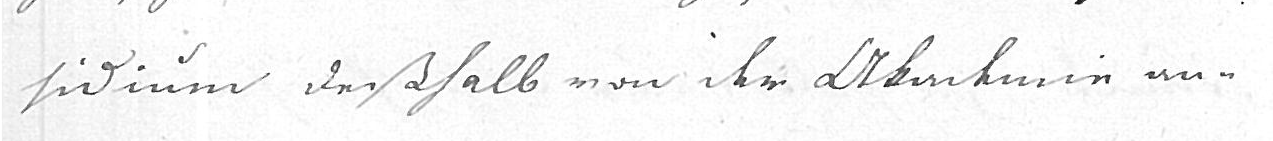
sidium deßhalb von der Akademie an-
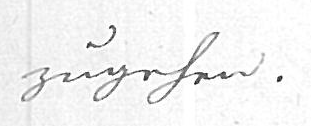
zugehen.
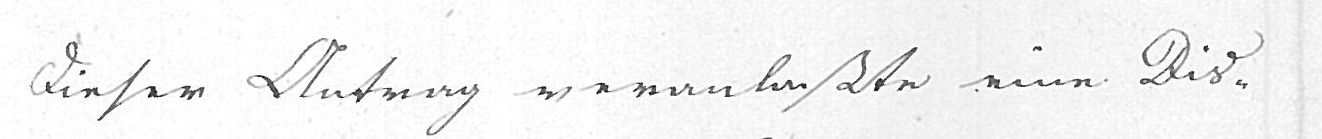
Dieser Antrag veranlaßte eine Dis-
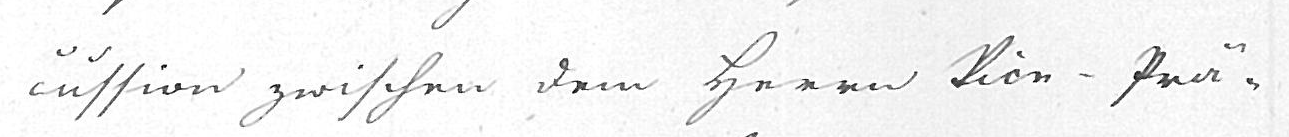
cussion zwischen dem Herrn Vice-Prä-
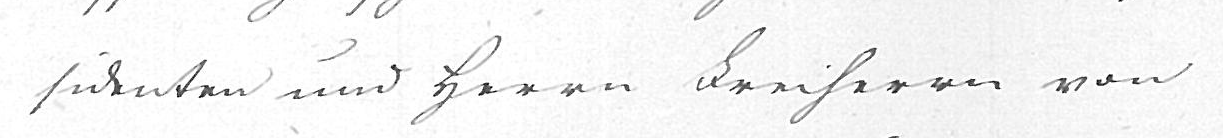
sidenten und Herrn Freiherrn von
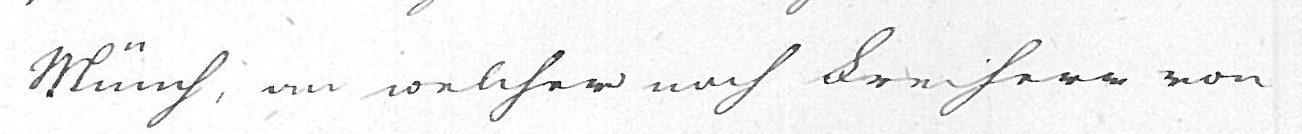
Münch, an welcher noch Freiherr von
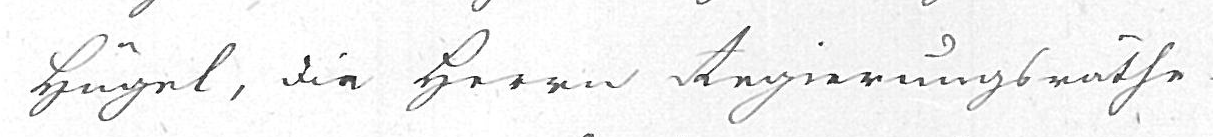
Hügel, die Herrn Regierungsräteh
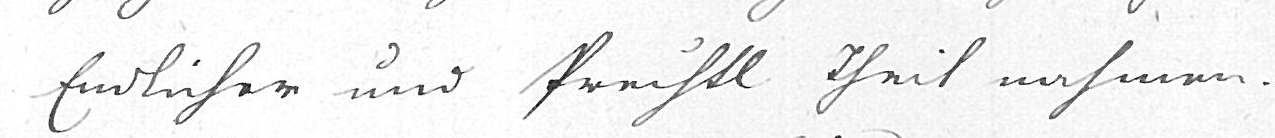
Endlicher und Prechtl Theil nahmen.
